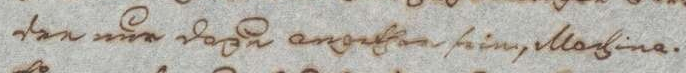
den nur dazu angethan sein, Machina-
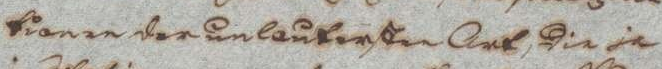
tionen der unlautersten Art, die ja
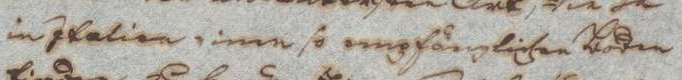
in Italien einen so empfänglichen Boden
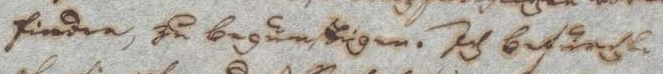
finden, zu begünstigen. Ich befürchte
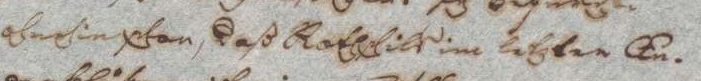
ohnehin schon, daß Rothschild im letzten Au-
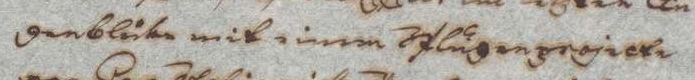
genblicke mit einem Splügenprojecte
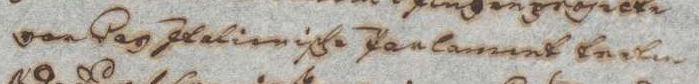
vor das Italienische Parlament treten
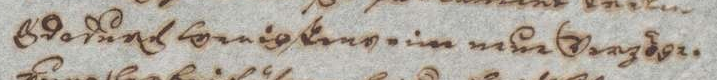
& dadurch wenigstens eine neue Verzöge-
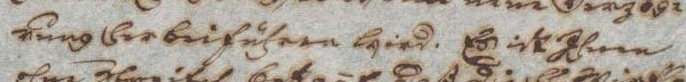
rung herbeiführen wird. Es ist Ihnen
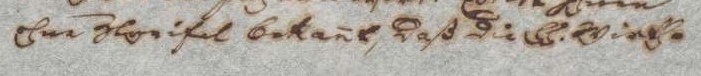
ohne Zweifel bekannt, daß dies HH. Wirth-
